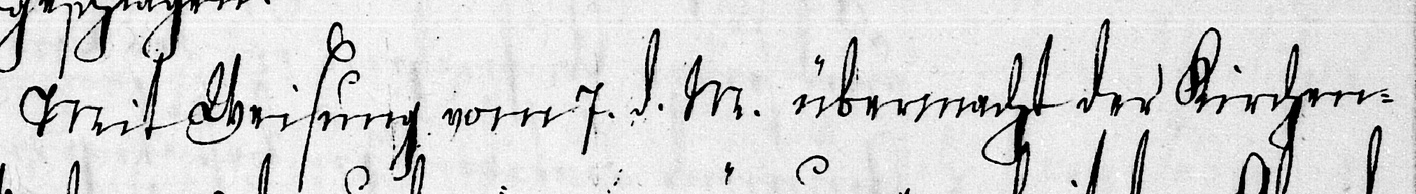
Mit Weisung vom 7. d. M. übermacht der Kirchen¬
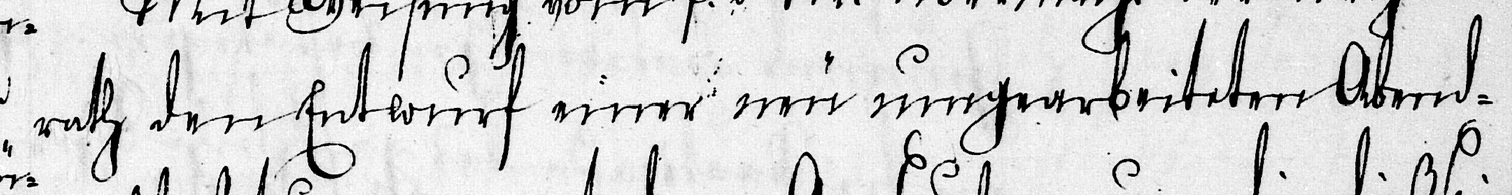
rath den Entwurf einer neu umgearbeiteten Abend¬
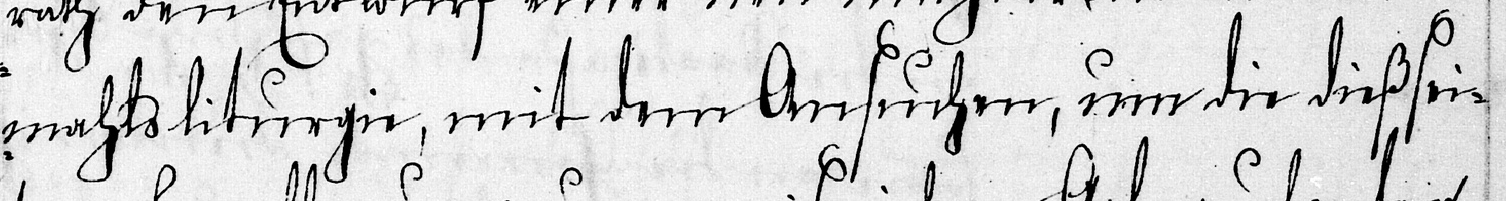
mahlsliturgie, mit dem Ansuchen, um die dießsei¬
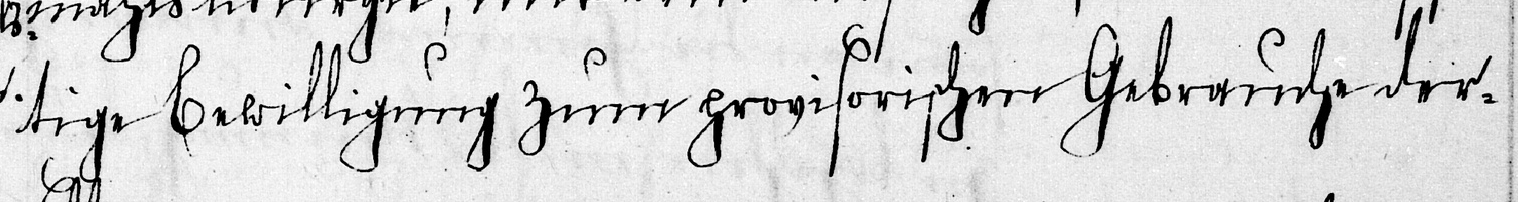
tige Bewilligung zum provisorischen Gebrauche der¬
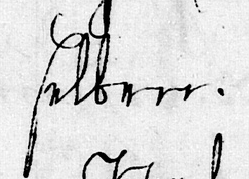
selben.
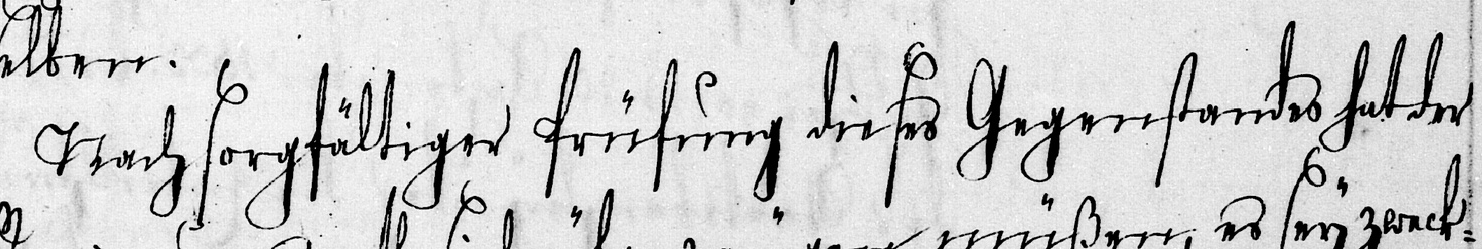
Nach sorgfältiger Prüfung dieses Gegenstandes hat der
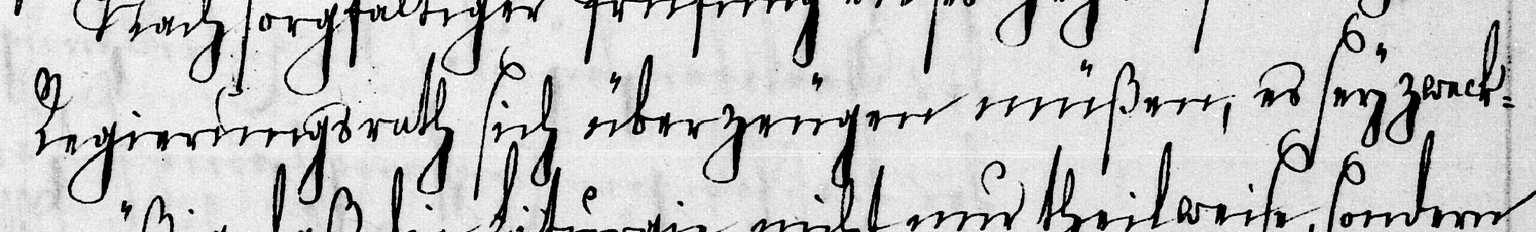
Regierungsrath sich überzeugen müßen, es sey zweck¬
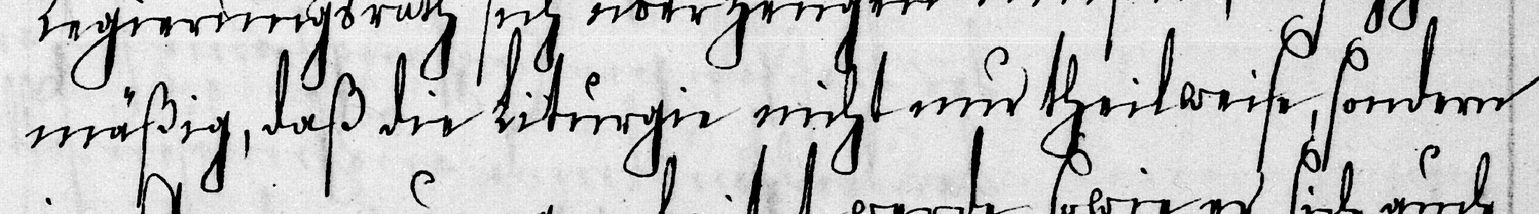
mäßig, daß die Liturgie nicht nur theilweise, sondern
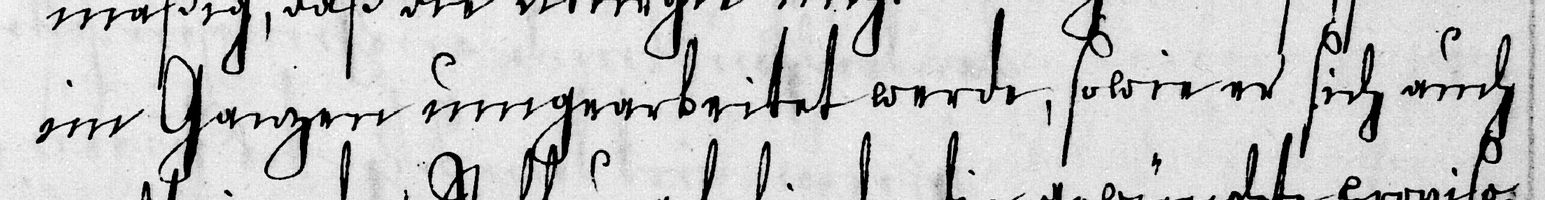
im Ganzen umgearbeitet werde, sowie er sich auch
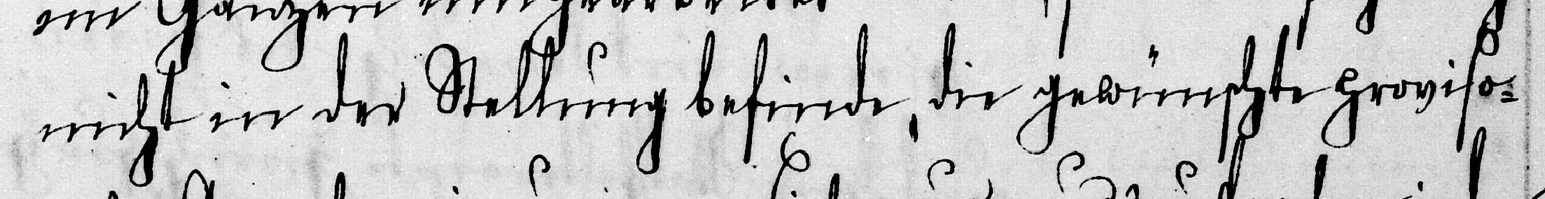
nicht in der Stellung befinde, die gewünschte proviso¬
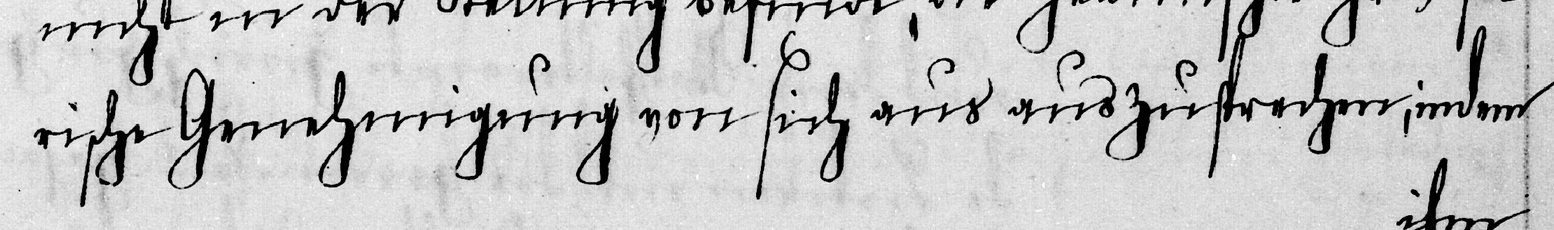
rische Genehmigung von sich aus auszusprechen, indem
